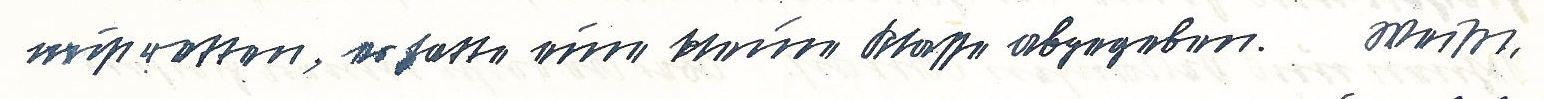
nicht retten, er hatte eine kleine Klasse abgegeben. Weißt,
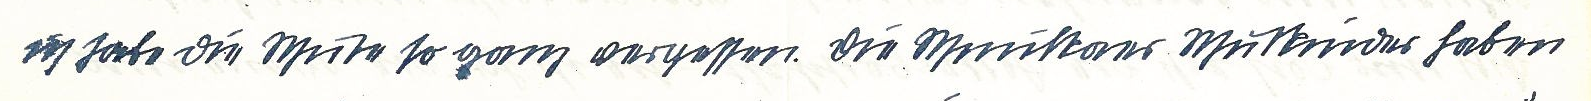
ich habe die Schule so ganz vergessen. Die Sch.-er Schulkinder haben
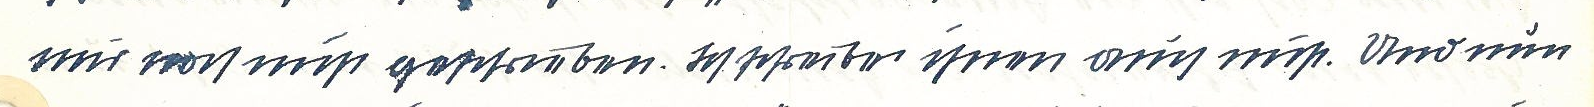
mir noch nicht geschrieben. Ich schreibe ihnen auch nicht. Und nun
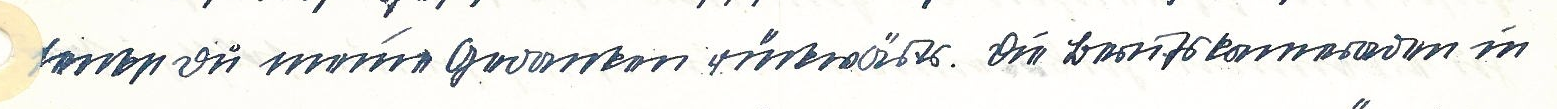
enkst Du meine Gedanken rückwärts. Die Berufskameraden in
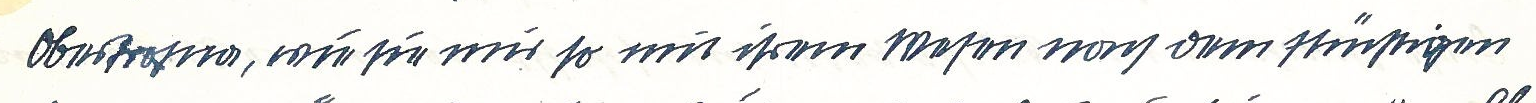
O., wie sie mir so mit ihrem Wesen nach dem flüchtigen
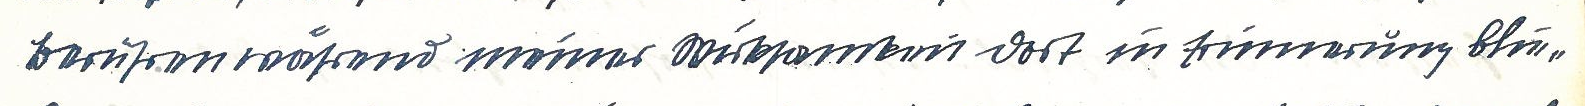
Berühren während meiner Wirksamkeit dort in Erinnerung blie¬
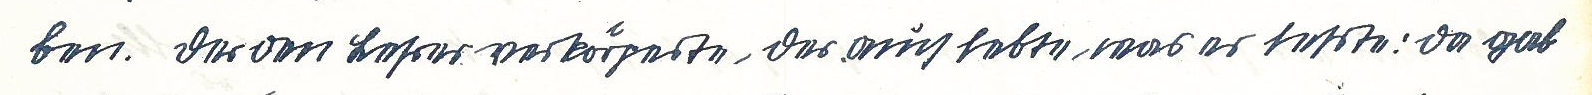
ben. Der den Lehrer verkörperte, der auch lebte, was er lehrte: da gab
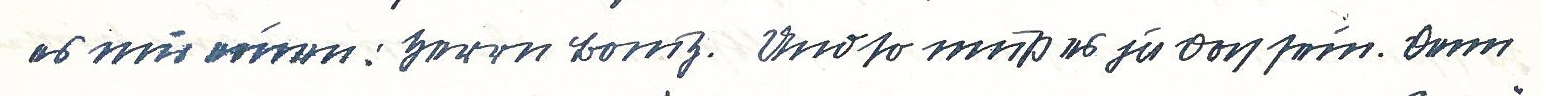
es nur einen: Herrn B.. Und so muß es ja doch sein. Denn
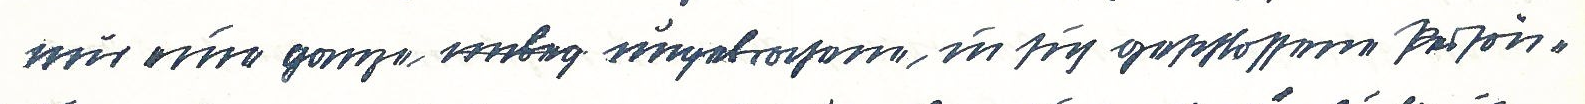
nur eine ganze, unbeg ungebrochene, in sich geschlossene Persön¬
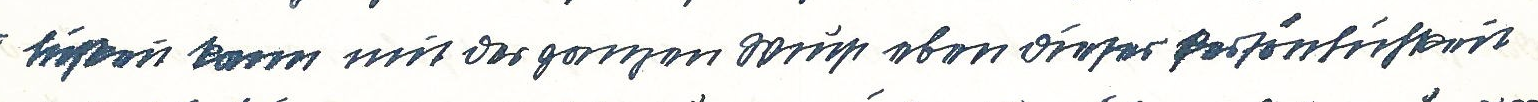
lichkeit kann mit der ganzen Wucht eben dieser Persönlichkeit
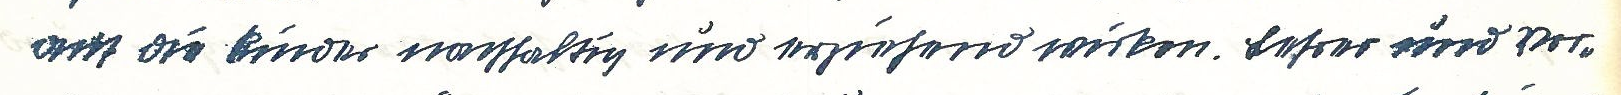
auf die Kinder nachhaltig und erziehend wirken. Lehrer und Vor¬
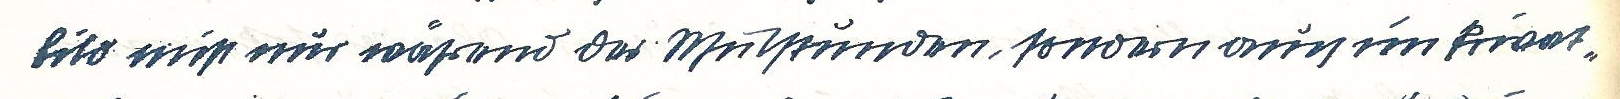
bild nicht nur während der Schulstunden, sondern auch im Privat¬
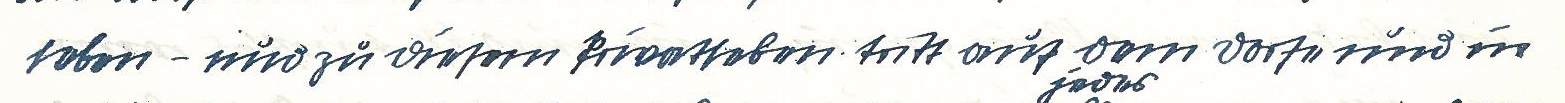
leben – und zu diesem Privatleben tritt auf dem Dorfe und in
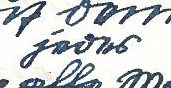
jedes
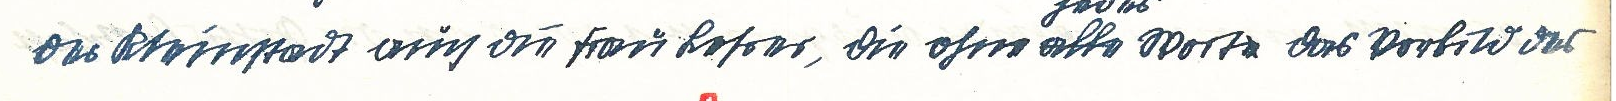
der Kleinstadt auch die Frau Lehrer, die ohne alleWorte das Vorbild des
